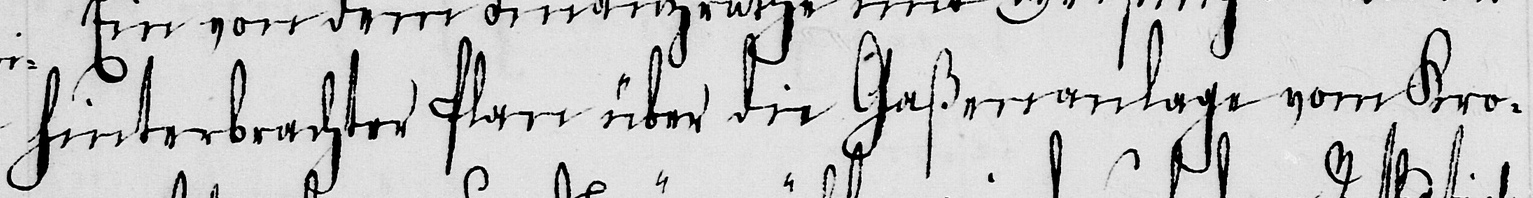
hinterbrachter Plan über die Gaßenanlage vom Kro¬
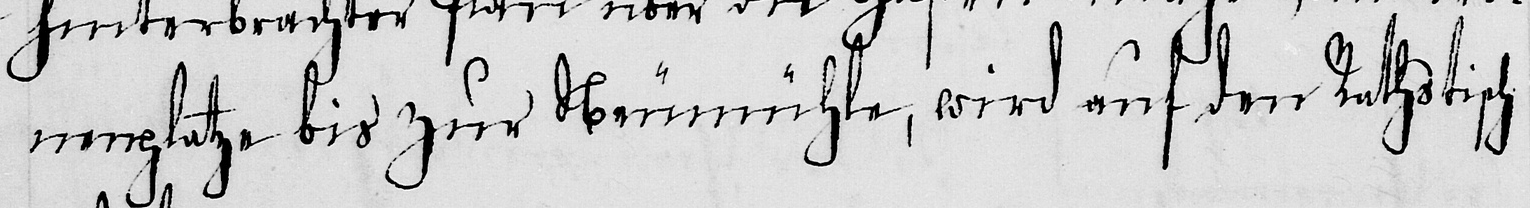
nenplatze bis zur Neumühle, wird auf den Rathstisch
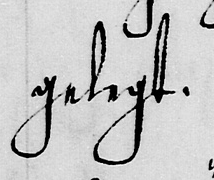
egt.
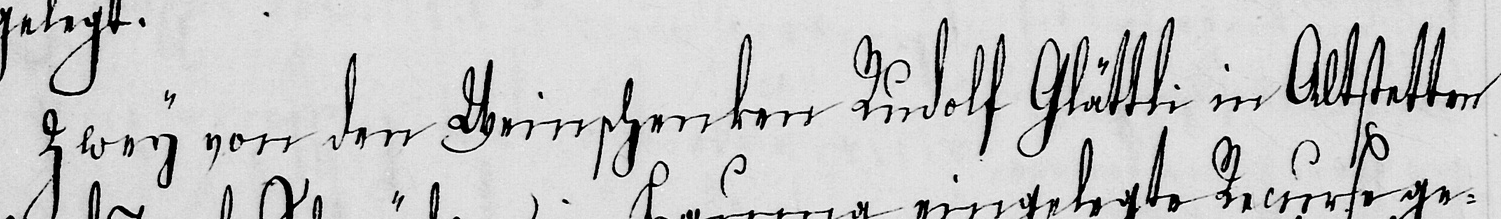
Zwey von den Weinschenken Rudolf Glättli in Altstet¬
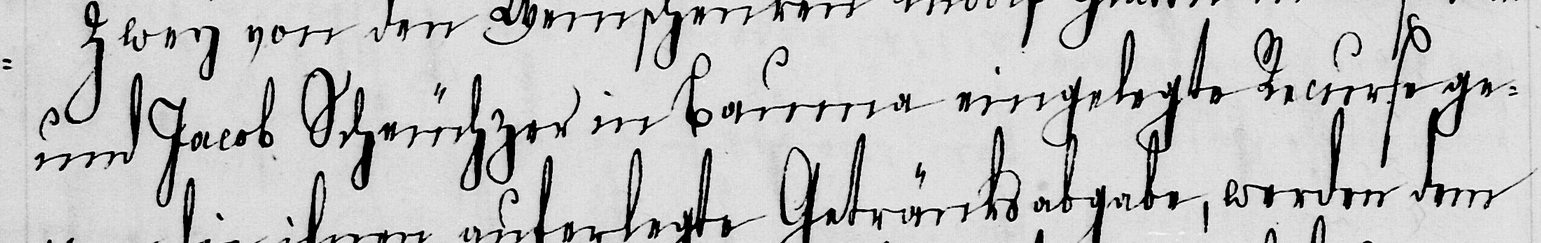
und Jacob Scheuchzer in Bauma eingelegte Recurse ge¬
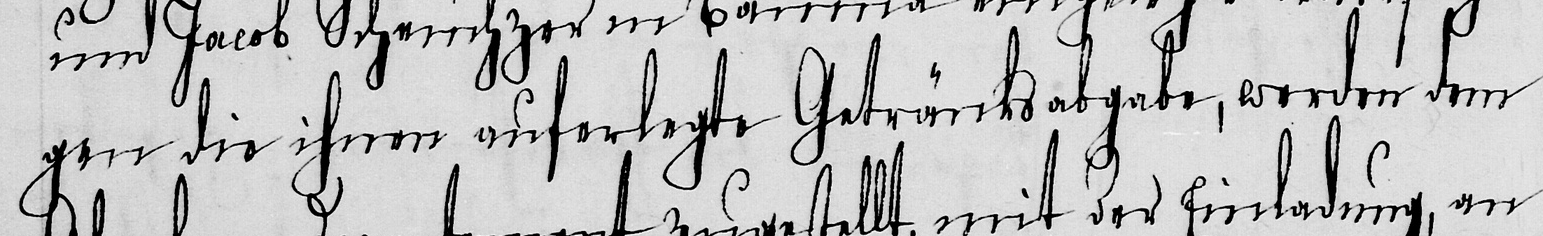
gen die ihnen auferlegte Getränksabgabe, werden dem
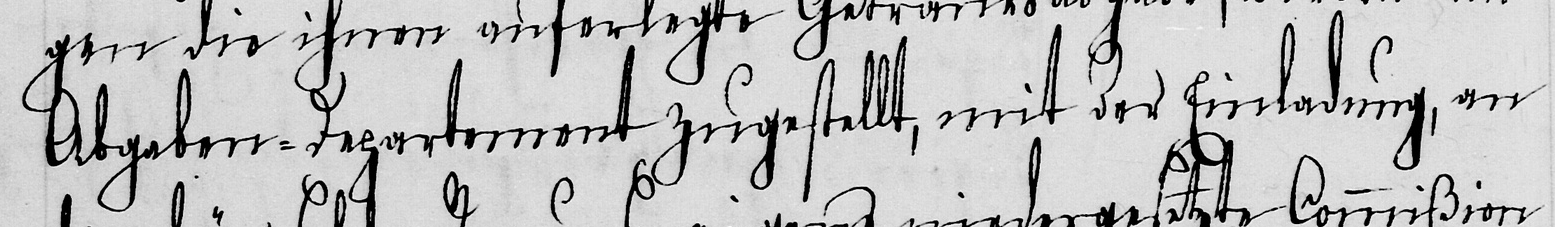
Abgaben-Departement zugestellt, mit der Einladung, an
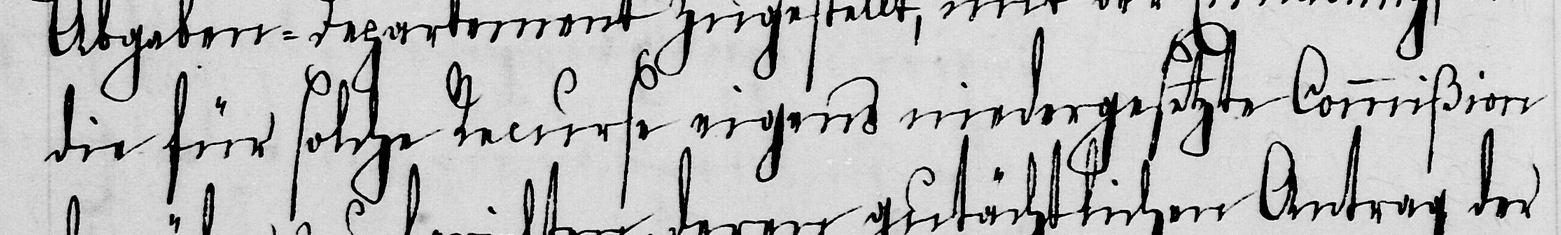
die für solche Recurse eigens niedergesetzte Commißion
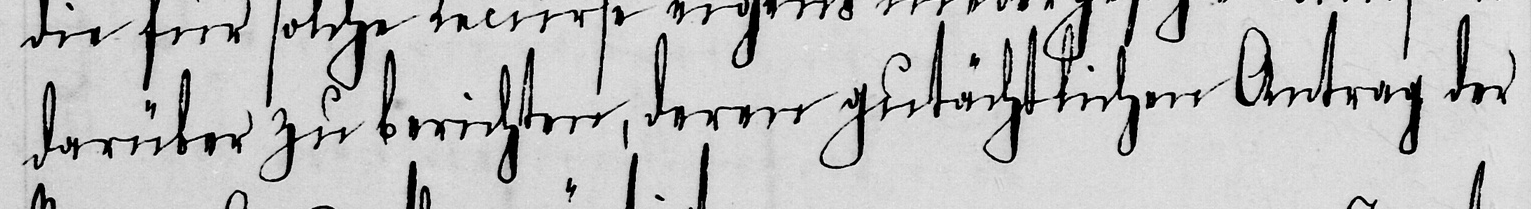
darüber zu berichten, deren gutächtlichen Antrag der
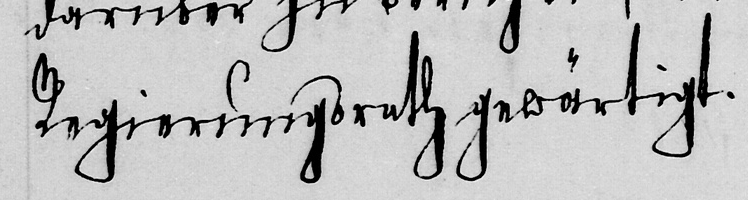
Regierungsrath gewärtigt.
